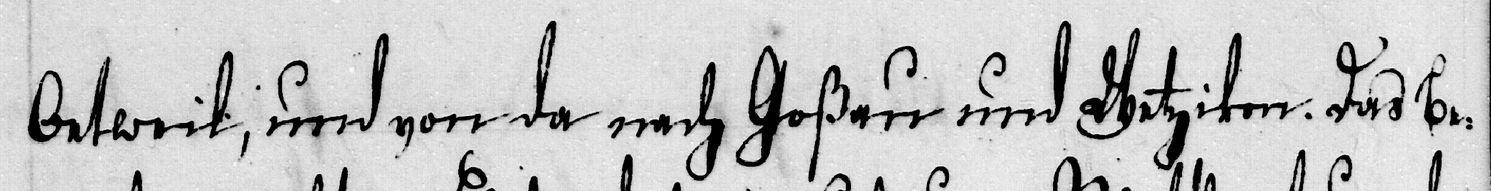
Oetweil, und von da nach Goßau und Wetzikon. Das B¬
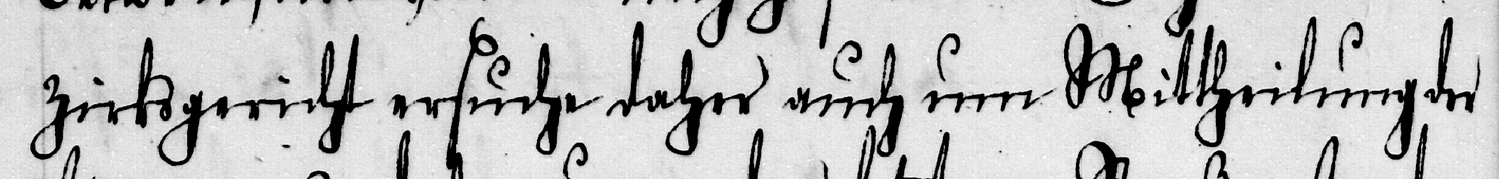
ezirksgericht ersuche daher auch um Mittheilung der
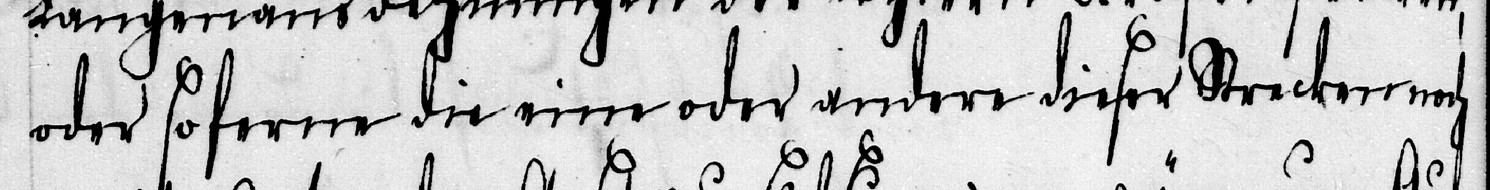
oder soferne die eine oder andere dieser Strecken
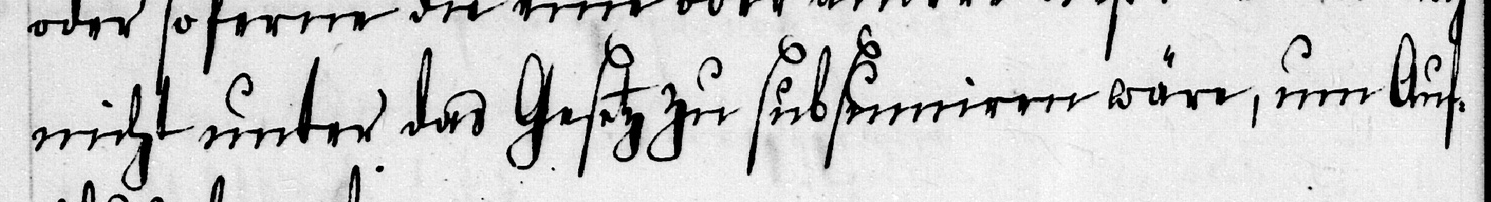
nicht unter das Gesetz zu subsumiren wäre, um Auf¬
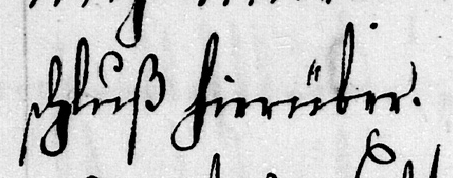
schluß hierüber.
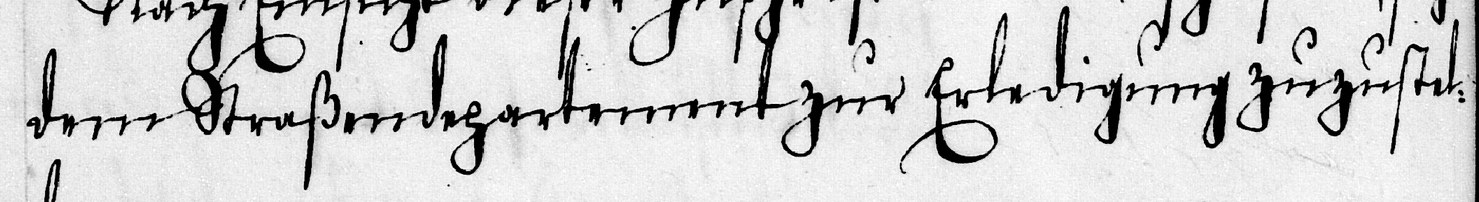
dem Straßendepartement zur Erledigung zuzustel¬
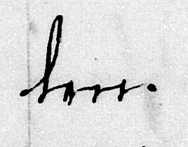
len.
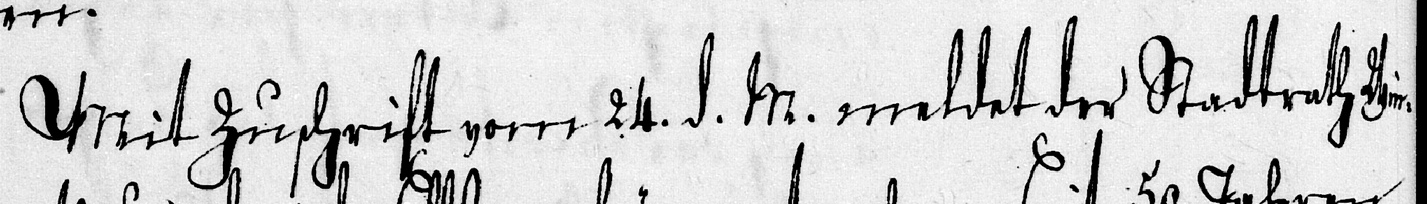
Mit Zuschrift vom 24. d. M. meldet der Stadtrath W¬
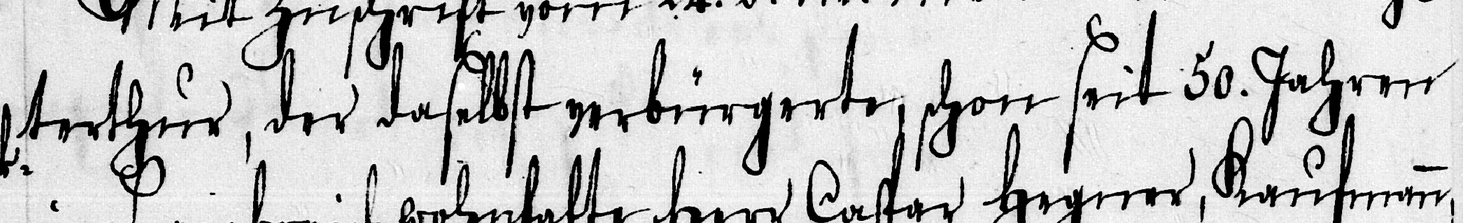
terthur, der daselbst verbürgerte, schon seit 50. Jahren
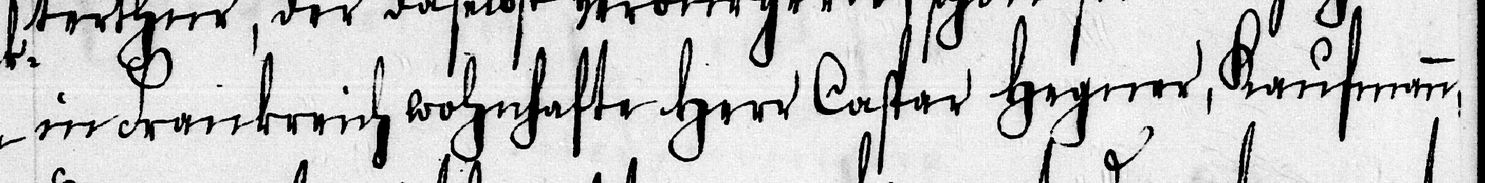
in Frankreich wohnhafte Herr Caspar Hegner, Kaufmann,
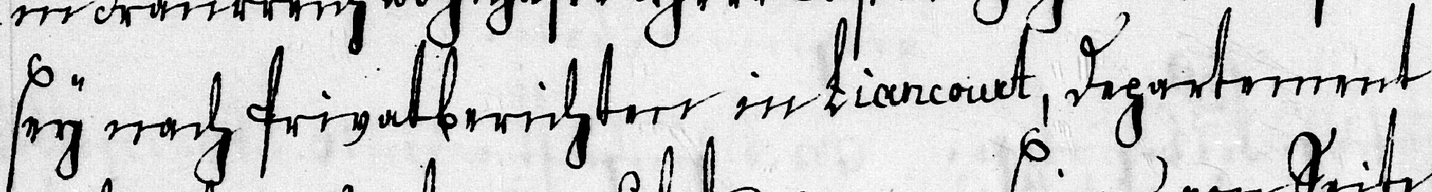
sey nach Privatberichten in Liancourt, Departement
